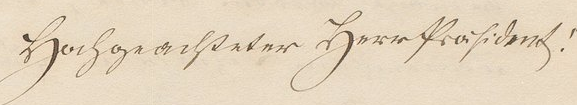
Hochgeachteter Herr Präsident!
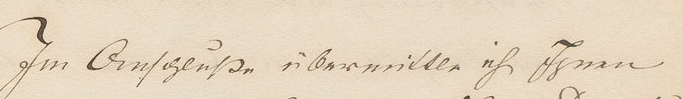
Im Anschluße übermittle ich Ihnen
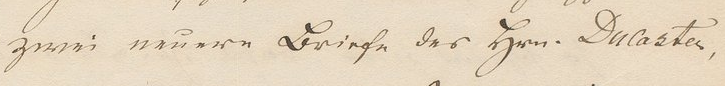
zwei neuere Briefe des Hrn. Du Coster,
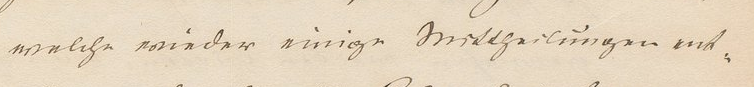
welche wieder einige Mittheilungen ent-
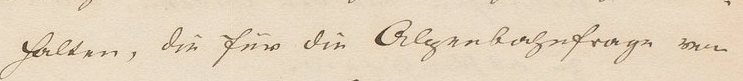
halten, die für die Alpenbahnfrage von
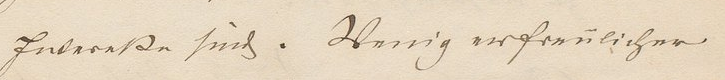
Intereße sind. Wenig erfreulicher
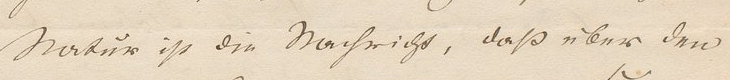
Natur ist die Nachricht, daß über den
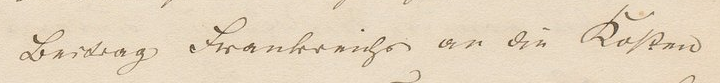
Beitrag Frankreichs an die Kosten
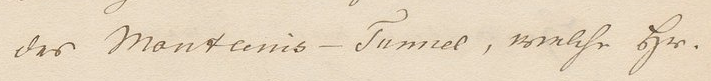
des Montcenis-Tunnel, welche Hr.
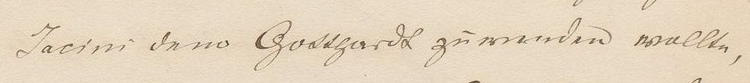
Jacini dem Gotthardt zuwenden wollte,
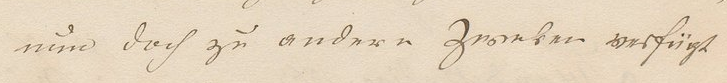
nun doch zu andern Zwecken verfügt
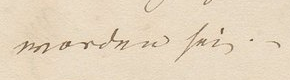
worden sei. –
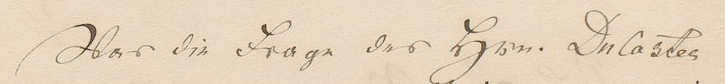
Was die Frage des Hrn. Du Coster
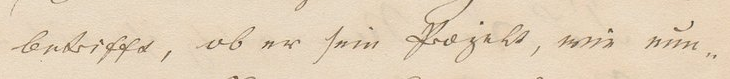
betrifft, ob er sein Projekt, wie nun-
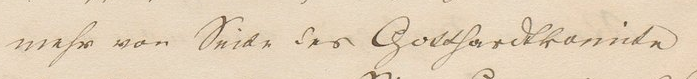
mehr von Seite des Gotthardtkomite
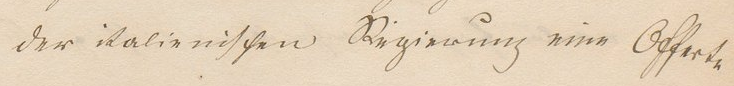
der italienischen Regierung eine Offerte
